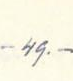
49
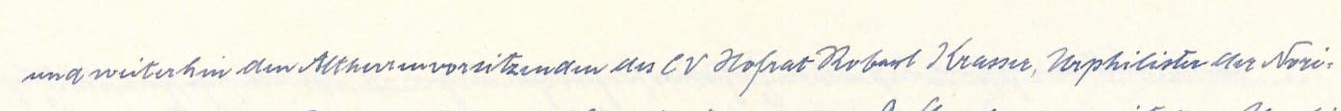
und weiterhin den Altherrenvorsitzenden des CV Hofrat Robert Krasser, Urphilister Nori-
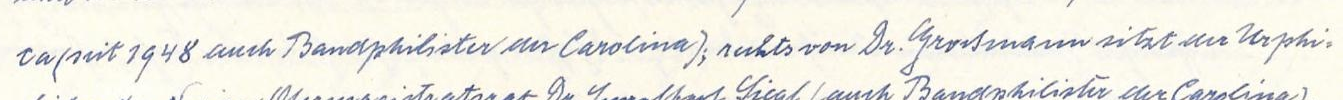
ca (seit 1948 auch Bandphilister der Carolina), rechts von Dr. Großmann sitzt der Urphi-
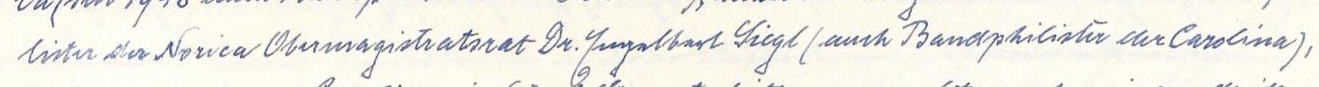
lister der Norica Obermagistratsrat Dr. Engelbert Siegl ( auch Bandphilister der Carolina),
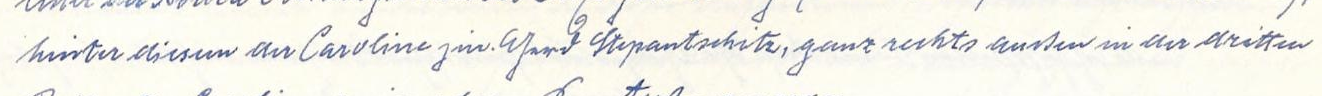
hinter diesem der Carolina iur. Gerd Stepantschitz, ganz rechts außen in der dritten
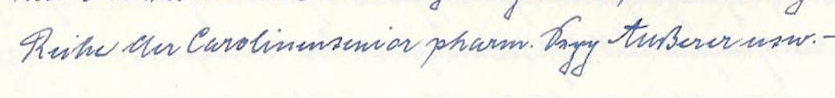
Reihe der Carolinensenior pharm. Sepp Außerer. usw.
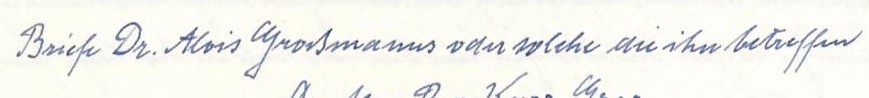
Briefe Dr. Alois Großmanns oder solche die ihn betreffen
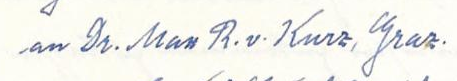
an Dr. Max R. v. Kurz Graz.
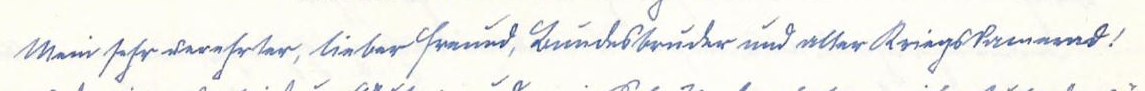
Meine sehr verehrter, lieber Freund, Bundesbruder und alter Kriegskamerad!
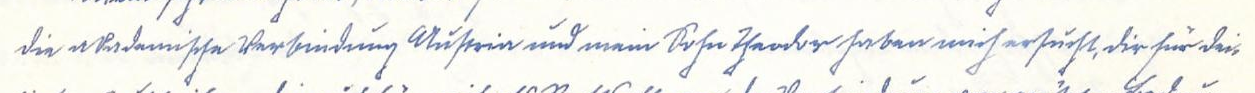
Die akademische Verbindung Austria und mein Sohn Theodor haben mich ersucht, dir für die-
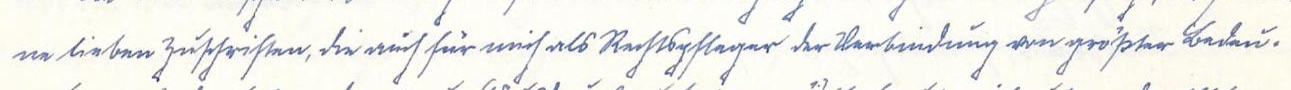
nen lieben Zuschriften, die auch für mich als Rechtspfleger der Verbindung von größter Bedeu-
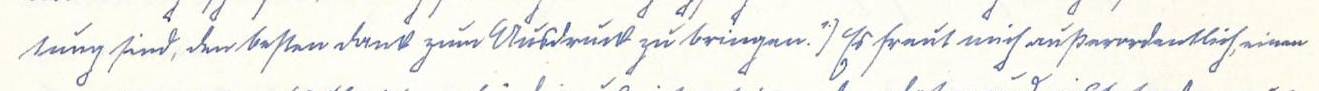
tung sind, den besten Dank zum Ausdruck zu bringen.1) Es freut mich außerordentlich, einen
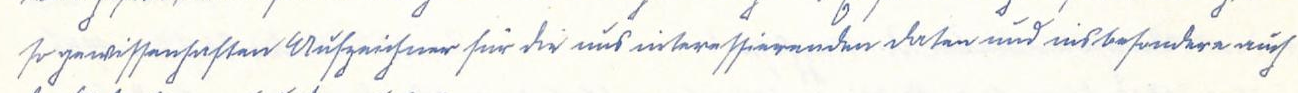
so gewissenhaften Aufzeichner für die uns interessierenden Daten und insbesondere auch
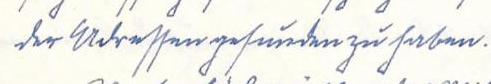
der Adressen gefunden zu haben.
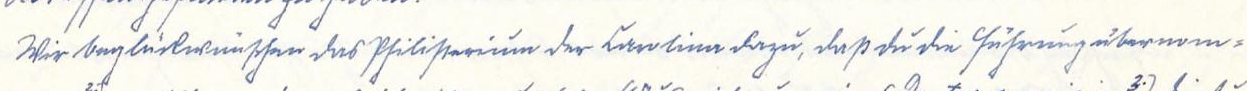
Wir beglückwünschen das Philisterium der Carolina dazu, daß du die Führung übernom-
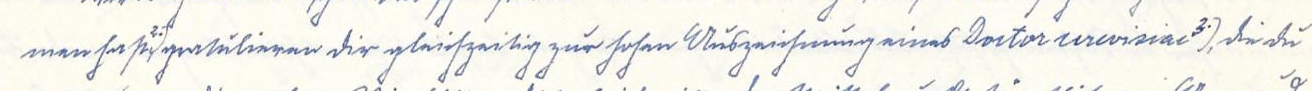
men hast.2), gratulieren dir gleichzeitig zur hohen Auszeichnung eines Doctor cervisiae 3), die du
